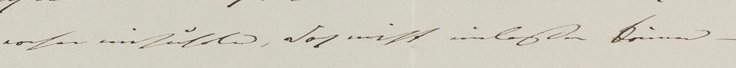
vorher einzuholen, doch nicht einlassen können. –
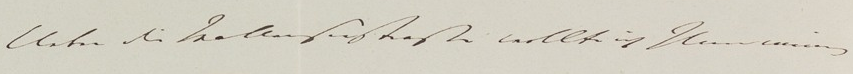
Ueber die Wallenseestraße wollte ich Ihnen meinen
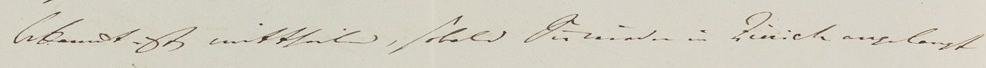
bekannt ist, mittheilen, sobald Sie wieder in Zürich angelangt
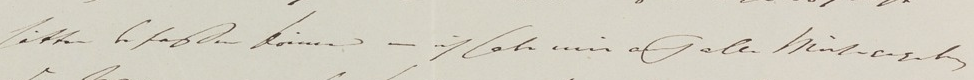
hätten befaßen können – ich habe mir auch alle Mühe gegeben,
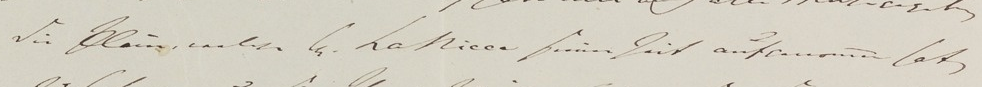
die Pläne, welche Hr. La Nicca seiner Zeit aufgenommen hat,
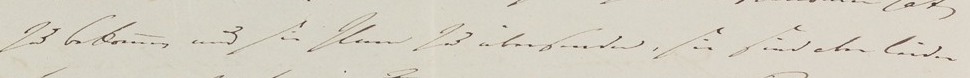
zu bekommen und sie Ihnen zu übersenden, sie sind aber leider
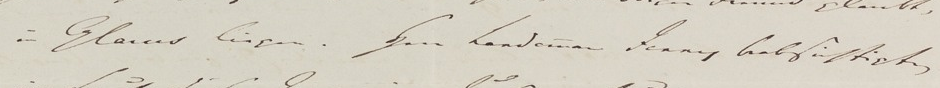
in Glarus liegen. Herr Landammann Jenny beabsichtigte,
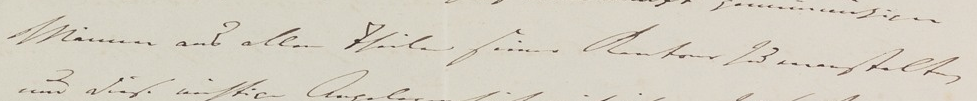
Männer aus allen Theilen seines Kantons zu veranstalten,
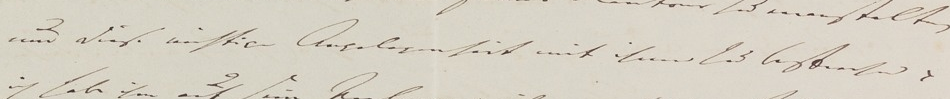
und diese wichtige Angelegenheit mit ihnen zu besprechen &
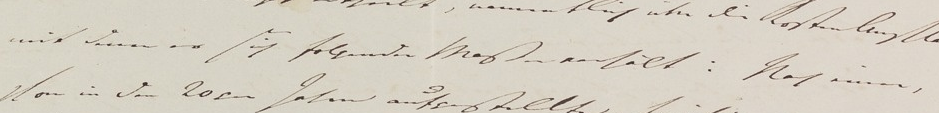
mit denen es sich folgender Maßen verhält: Nach einer,
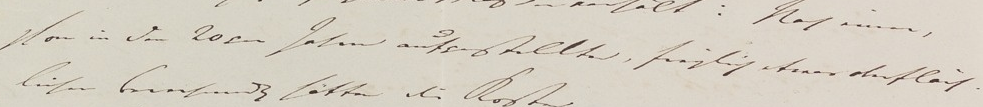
schon in den 20ger Jahren aufgestellten, freylich etwas oberfläch-
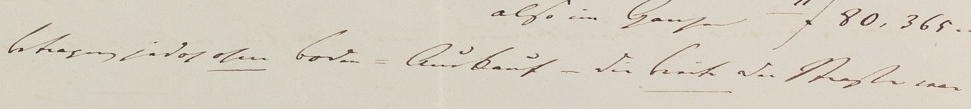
betragen, jedoch ohne Boden-Auskauf – die Breite der Straße von
